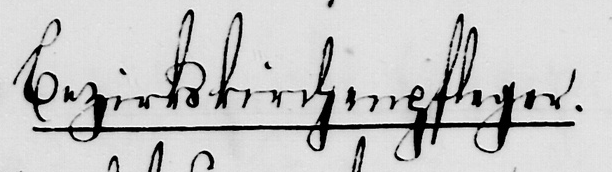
Bezirkskirchenpfleger.
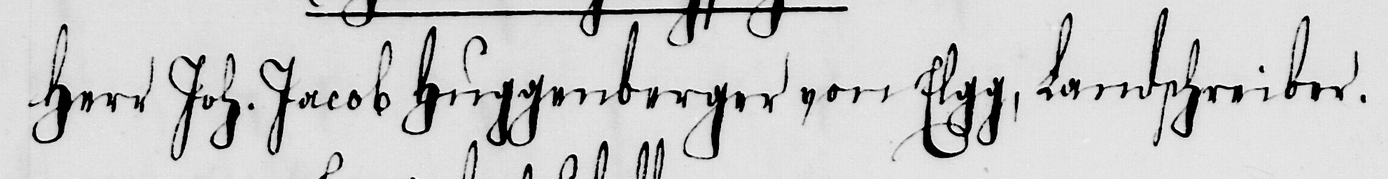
Herr Joh. Jacob Huggenberger von Elgg, Landschreiber.
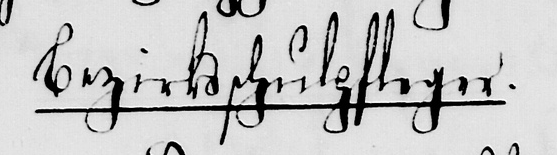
Bezirksschulpfleger.
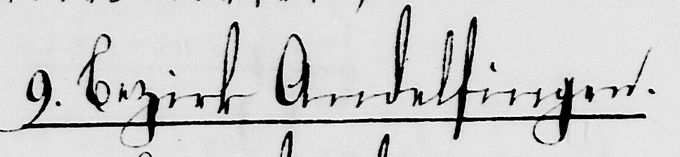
9. Bezirk Andelfingen.
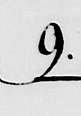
r.
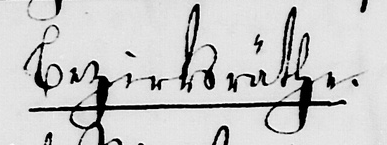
Bezirksräthe.
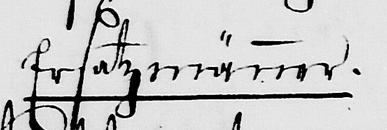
Ersatzmänner.
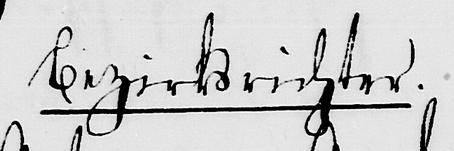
Bezirksrichter.
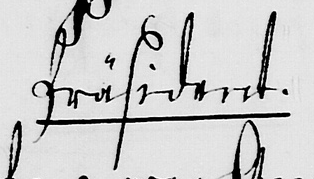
Präsident.
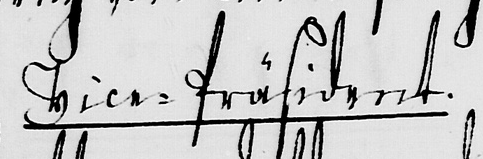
Vice-Präsident.
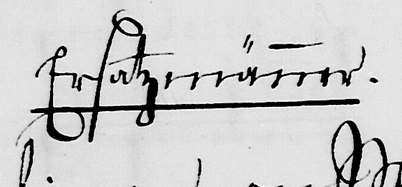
Ersatzmänner.
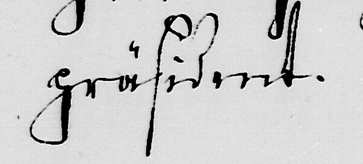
präsident.
